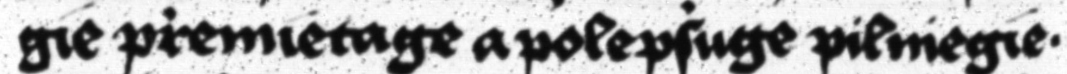gíe pṙemíetage a polepẛuge pilniegíe.
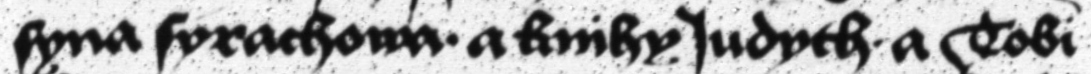ſyna ſyrachowa. a knihy Iudych. a Tobi
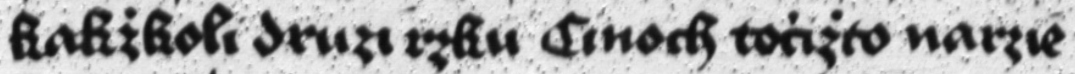kakżkoli druzí rzku Ċinoch toċiżto narzíe
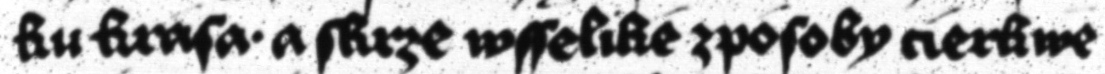ku kráſa. a ſkrze wſſeliké zpóſoby cíerkwe
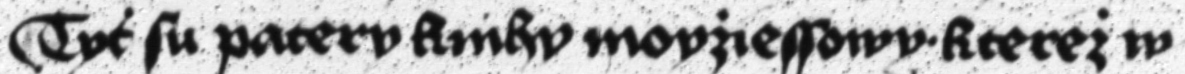Tyṫ su paterv knihy moyżieſſowy. kteréż w
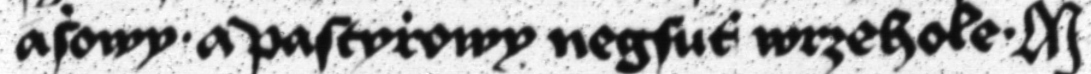aẛowy. a Paſtyṙowy negſuṫ wrzehole. M
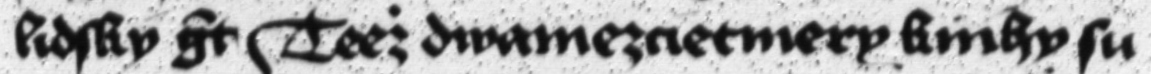lidský ḡt Teeż dwamezcietmery kṅíhy ſu
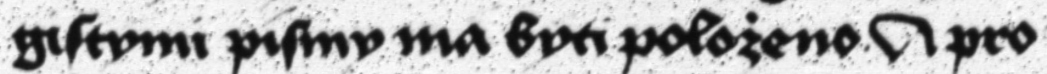giſtymi píſmy ma byti polożeno. A pro
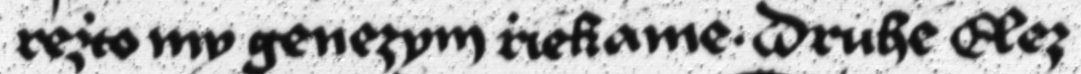reżto my genezym ṙiekanie. Druhe Elez
